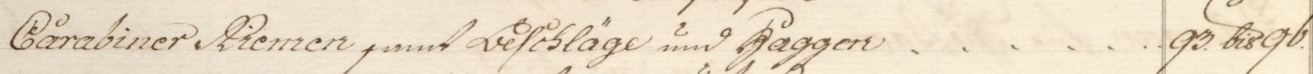Carabiner Riemen samt Beschläge und Haggen. 93. bis 96.
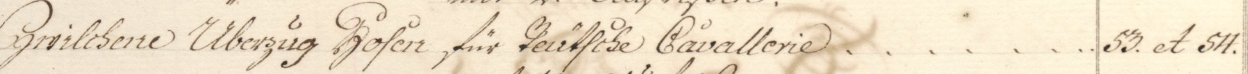Zwilchene Überzug Hosen für Teütsche Cavallerie. 53. et 54.
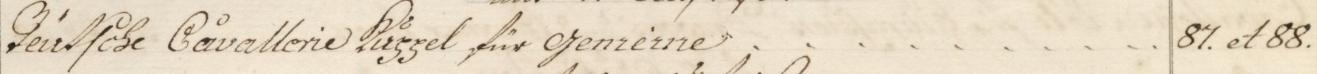Teütsche Cavallerie Kuppel für Gemeine. 87. et 88.
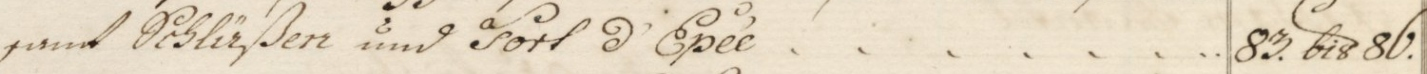samt Schlüßen und Port d'Epée. 83. bis 86.
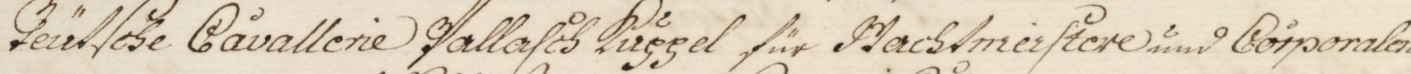Teütsche Cavallerie Pallasch Kuppel für Wachtmeistere und Corporalen
